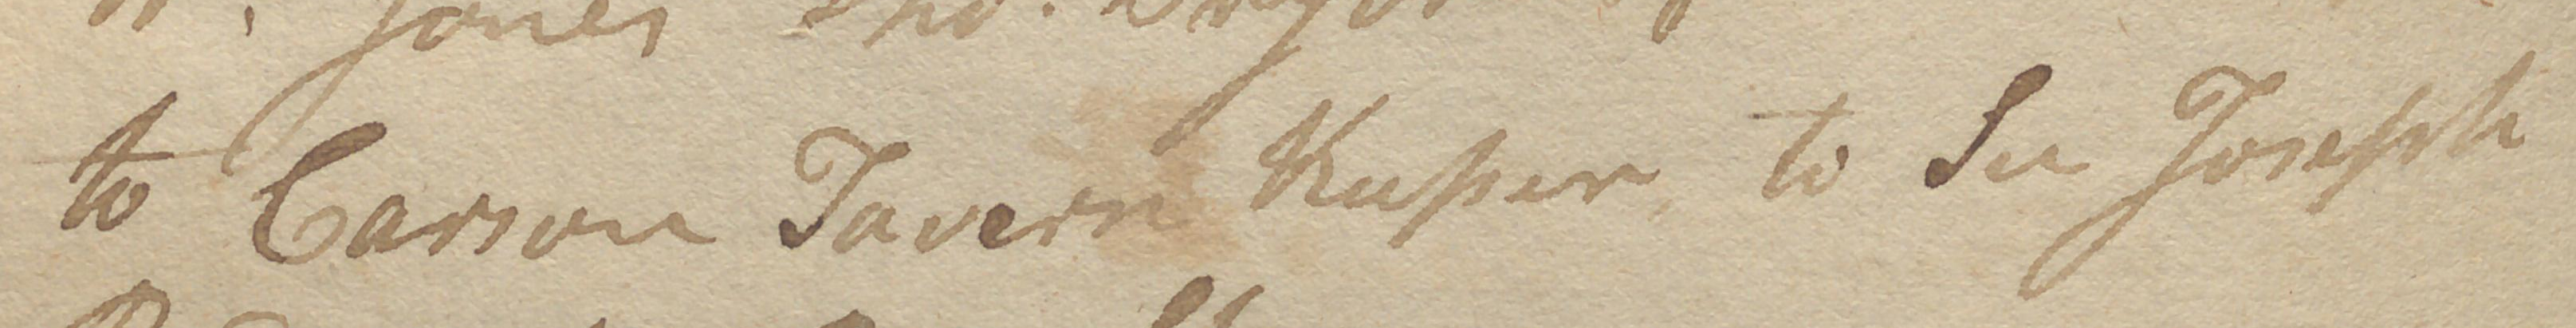to Carson Tavern Keeper to See Joseph
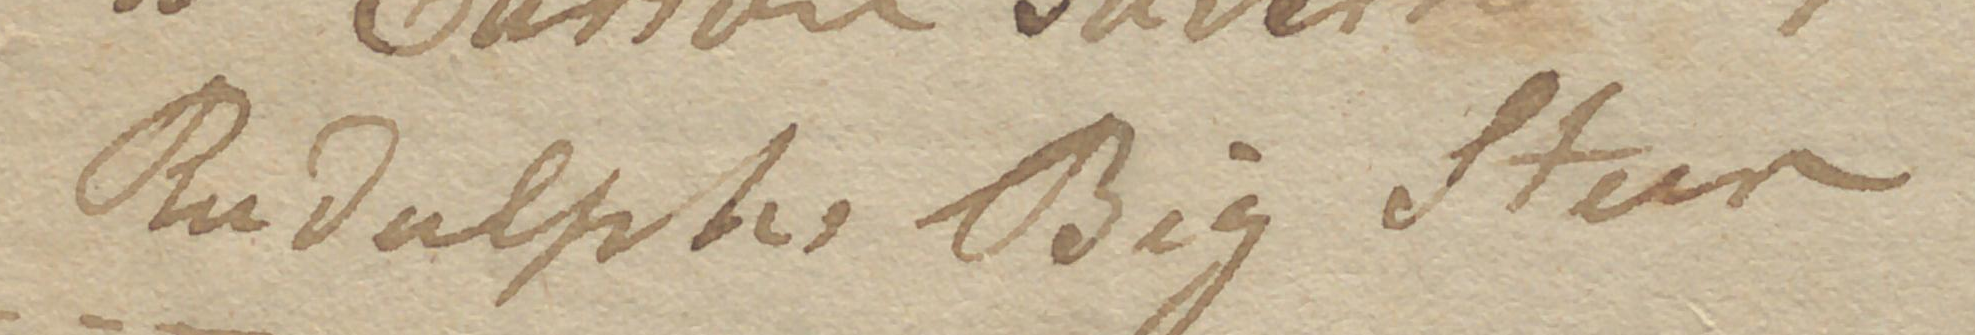Rudalphs Big Steer
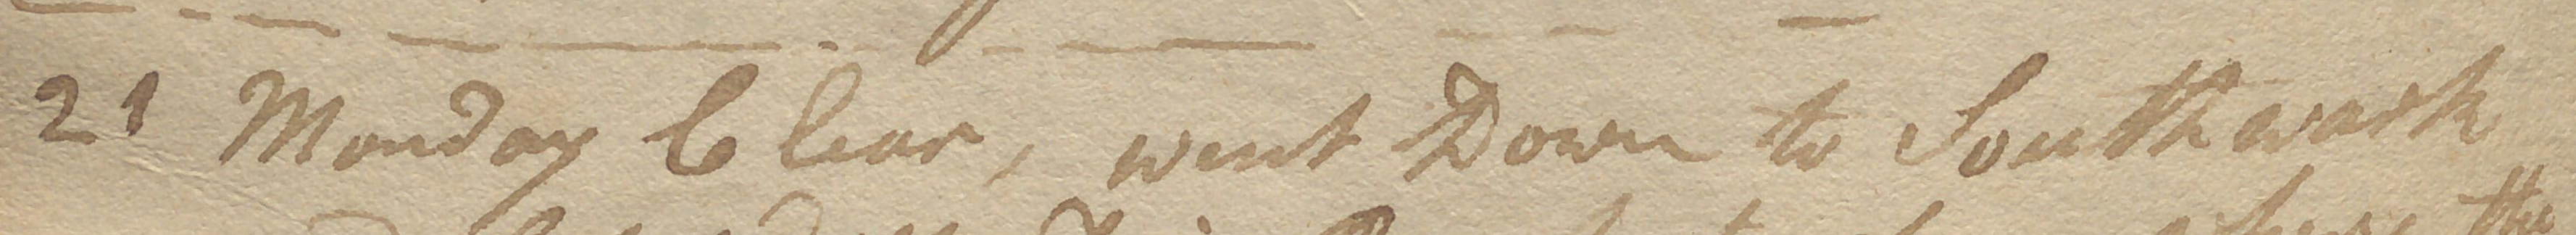21 Monday Clear, went Down to Southwark
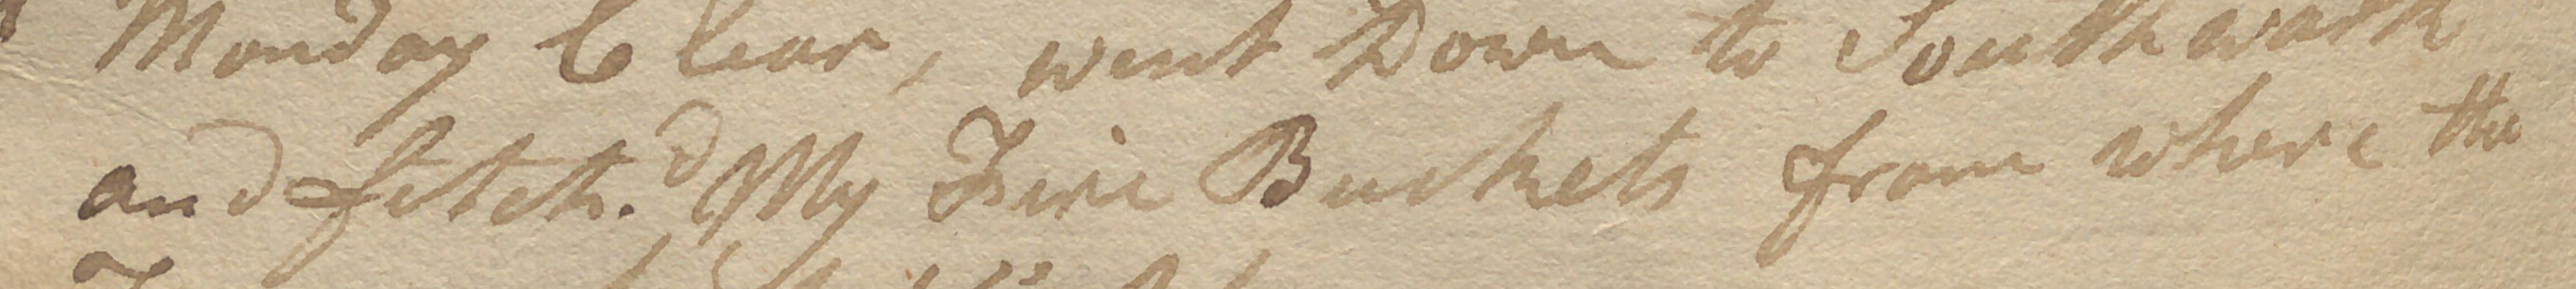and fetch^d. My Fire Buckets from where the
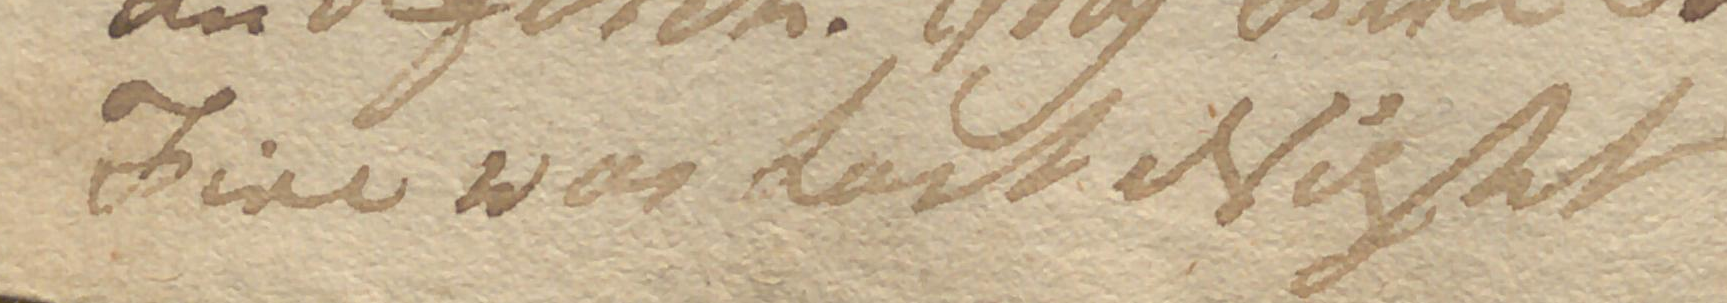Fire was Last Night
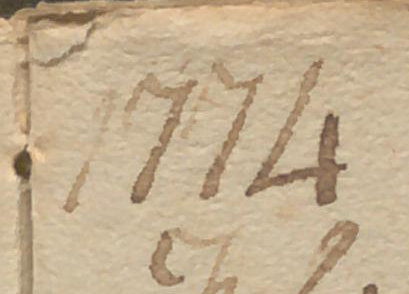1774
